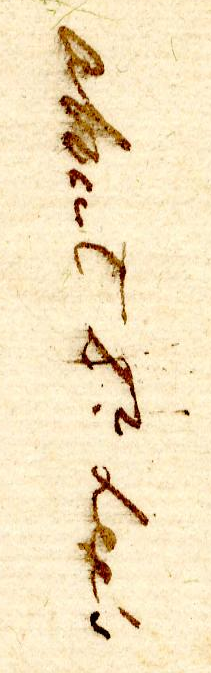about D^r Lee's
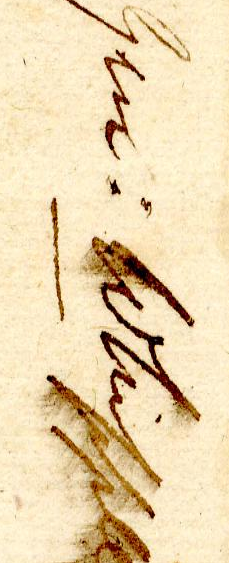Gen: Whipple
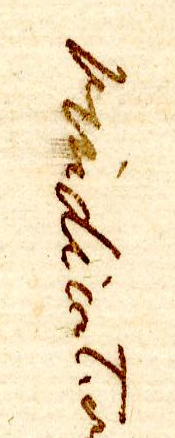vindicated
